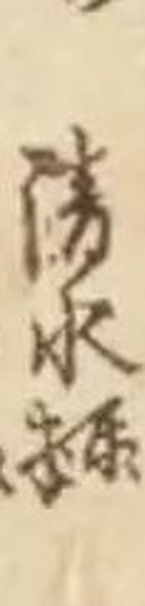清水様
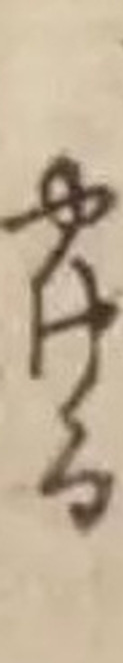やける
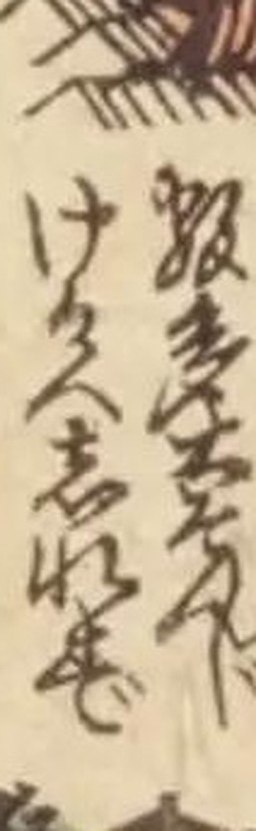けが人しれず
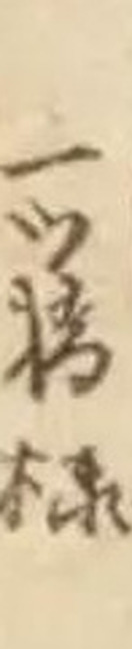一ツ橋様
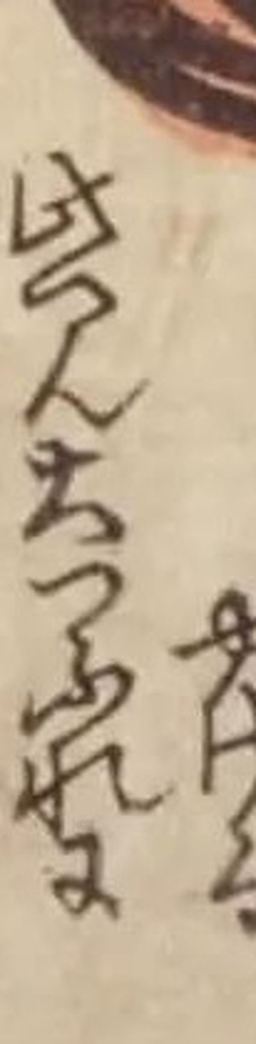此へん大つふれすに
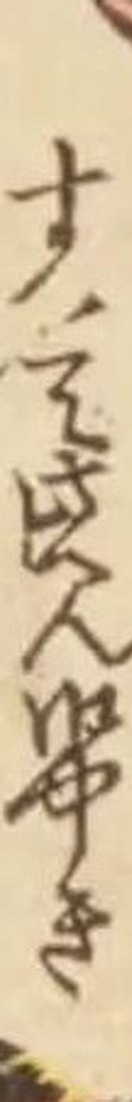すて此へん御やしき
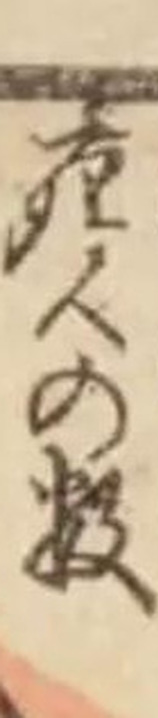死人の数
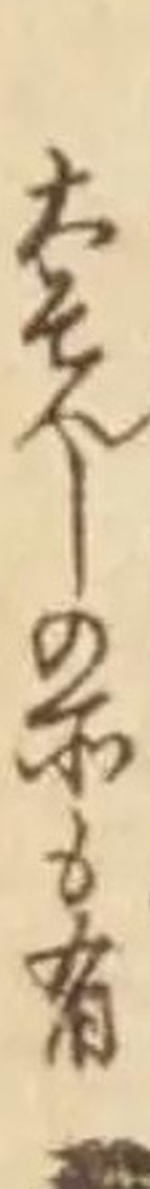大そんじの所も有
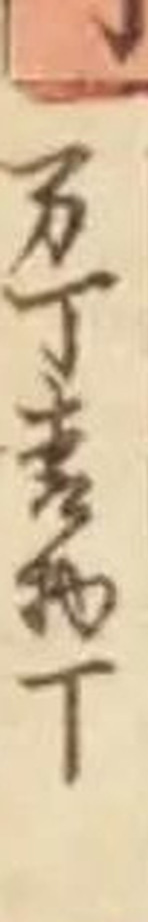万丁青物丁
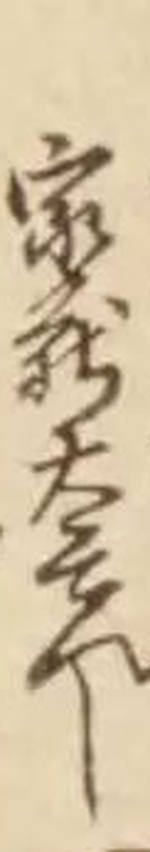家所大そんし
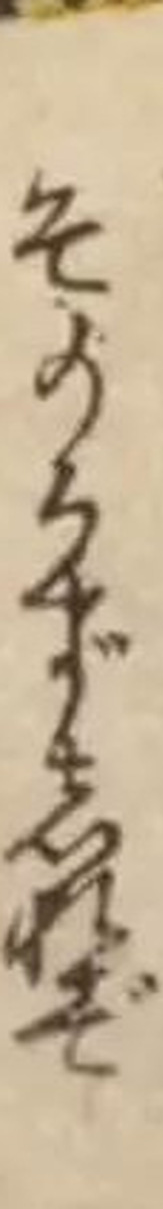そのかずしれず
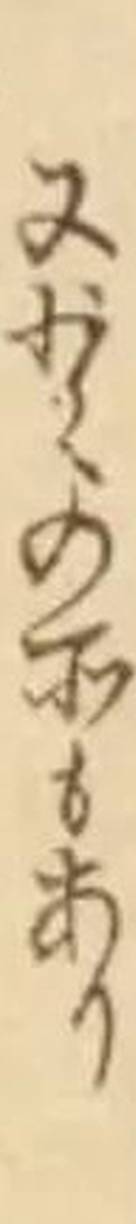又少しの所もあり
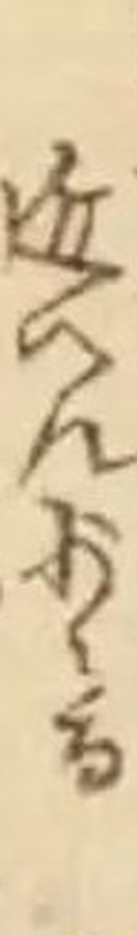近へん少しる
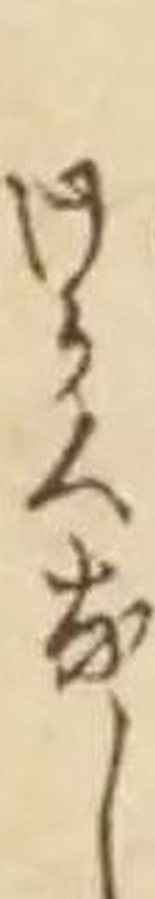けか人なし
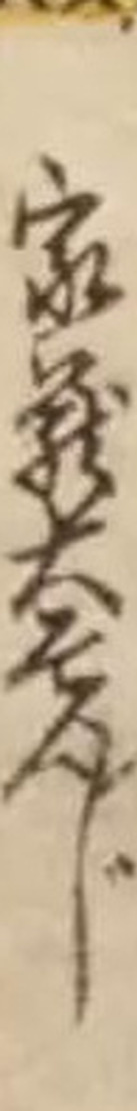家蔵大そんじ
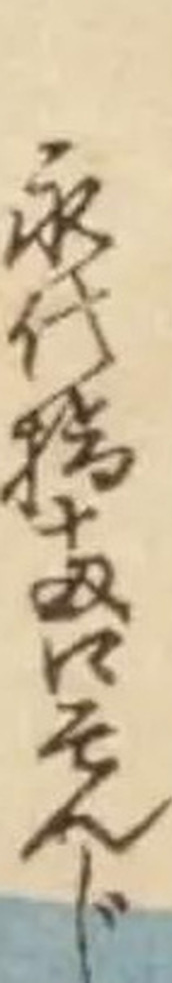永代橋十画口そんじ
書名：銘細改板江戸大地震出火場所附
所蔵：国立国会図書館 National Diet Library, JAPAN
